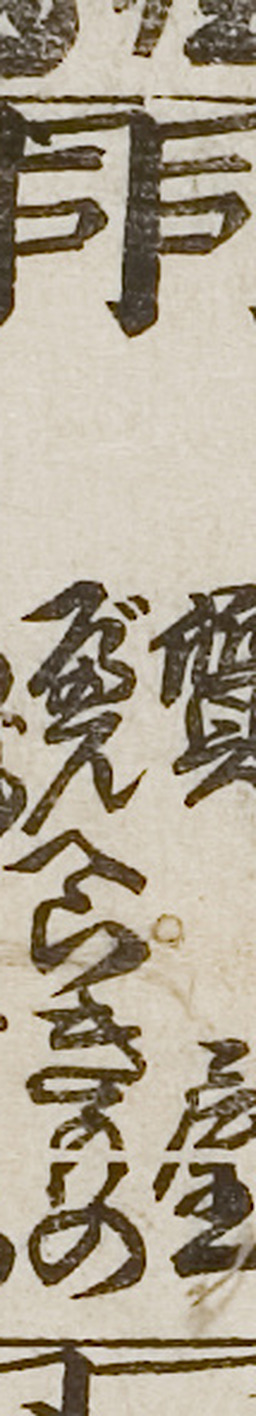同べんへらきもの
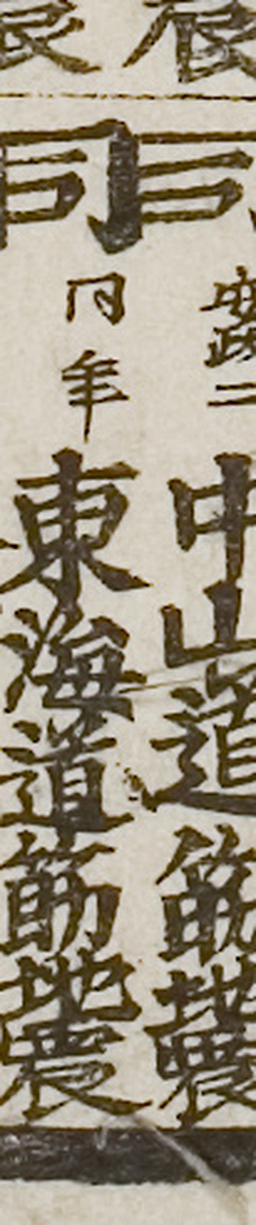同同年東海道筋地震
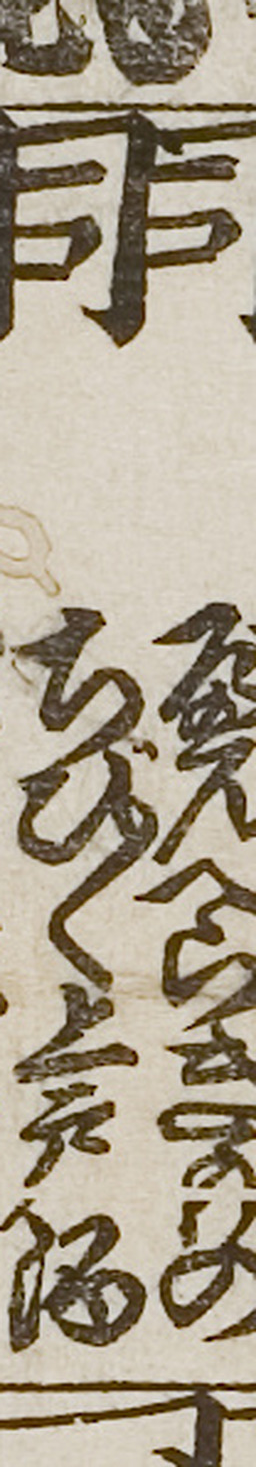同ちび〳〵上戸酒
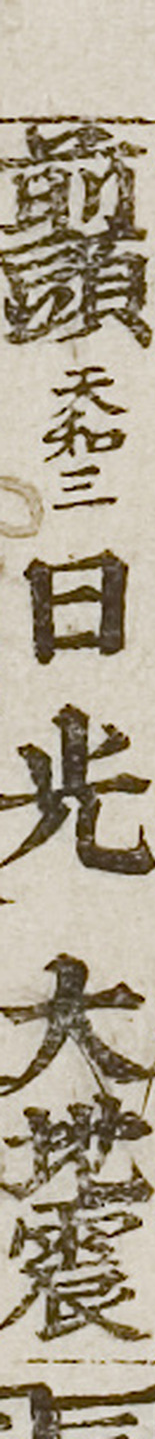前頭天和三日光大地震
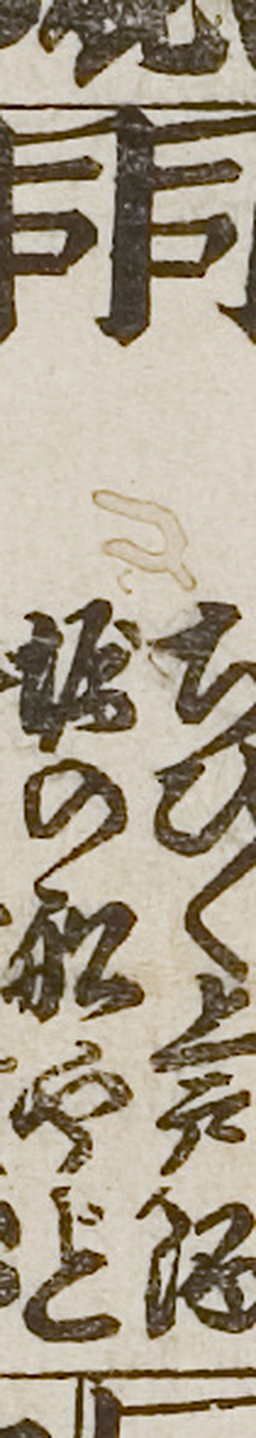同堀の船やど
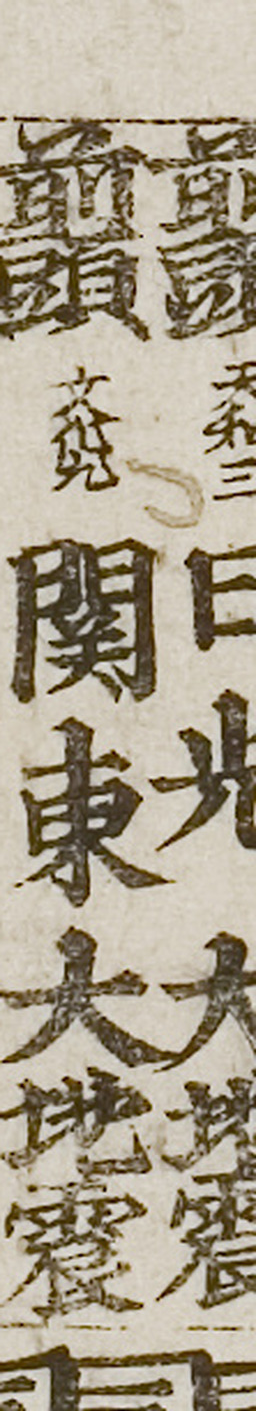前頭文化九関東大地震
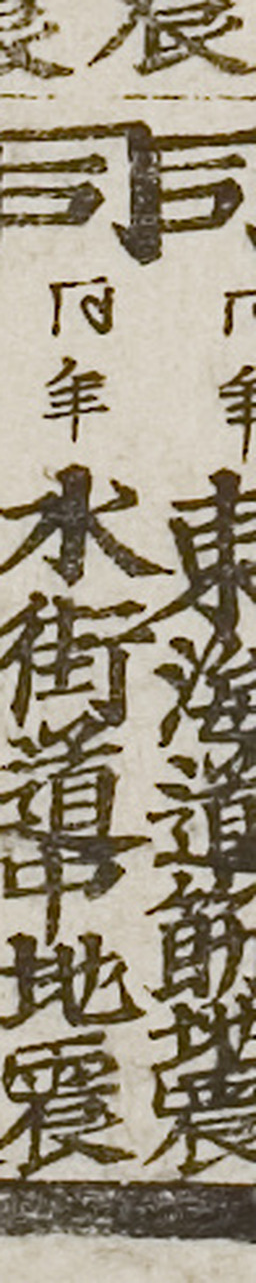同同年水街道中地震
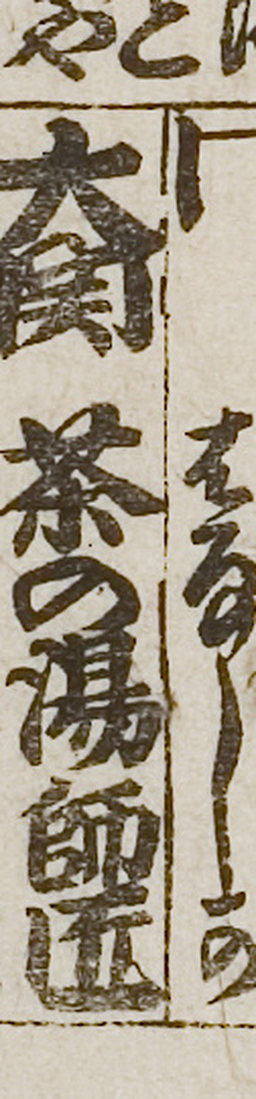大関茶の湯師匠
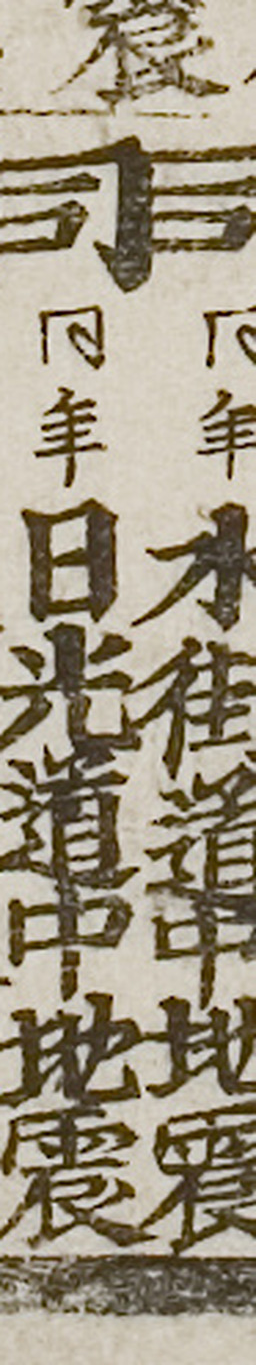同同年日光道中地震
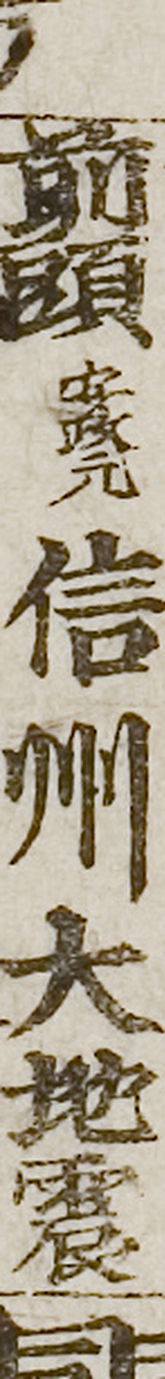前頭安政元信州大地震
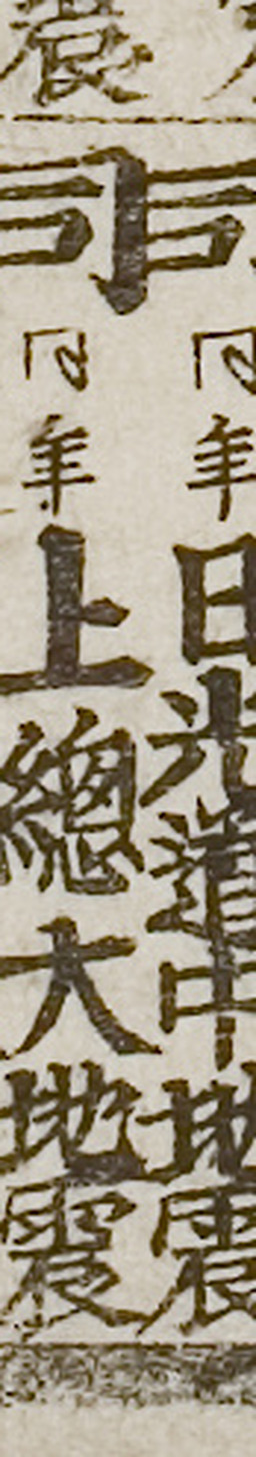同同年上総大地震
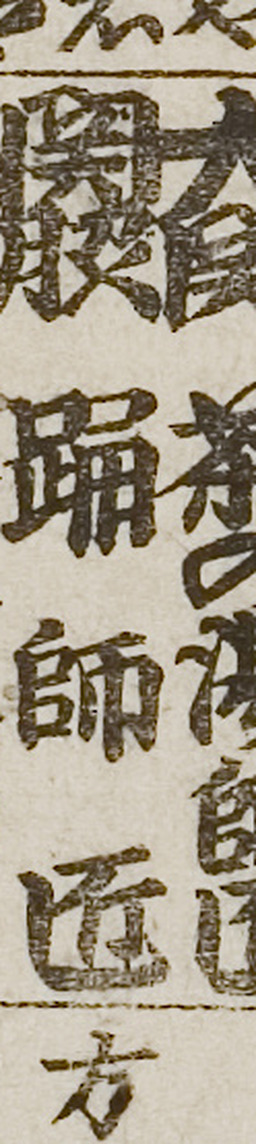関取踊師匠
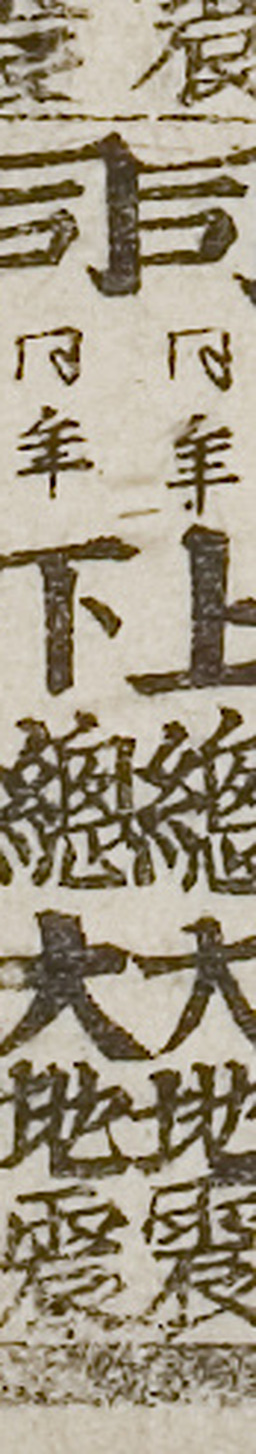同同年下総大地震
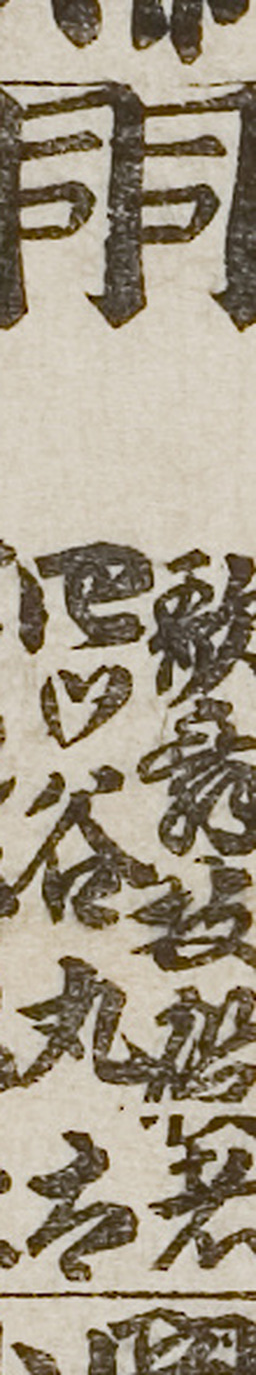同四ツ谷丸太
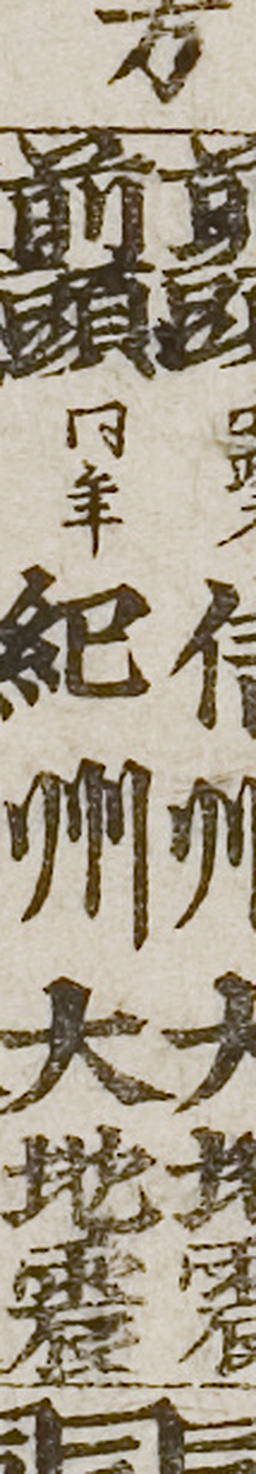前頭同年紀州大地震
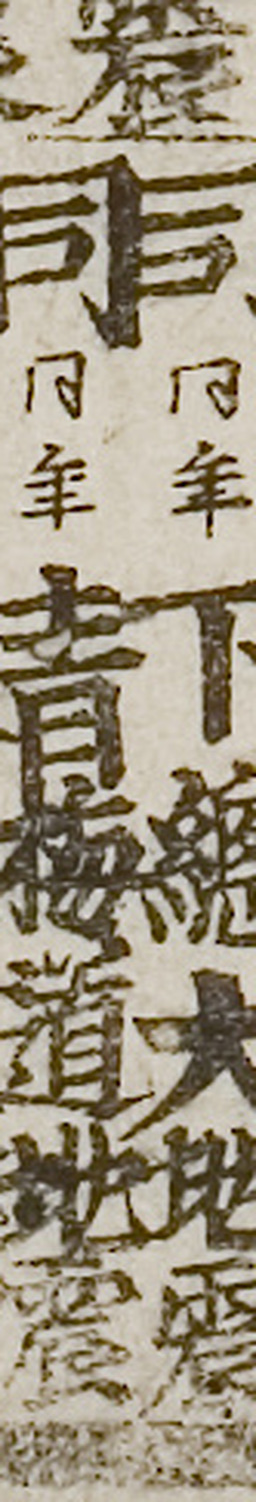同同年青梅道地震
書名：世中当座帳
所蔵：東京大学総合図書館 General Library in the University of Tokyo, JAPAN
